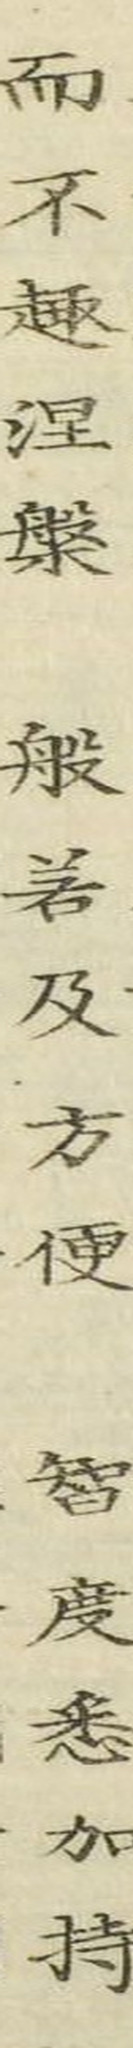而不趣涅槃般若及方便智度悉加持
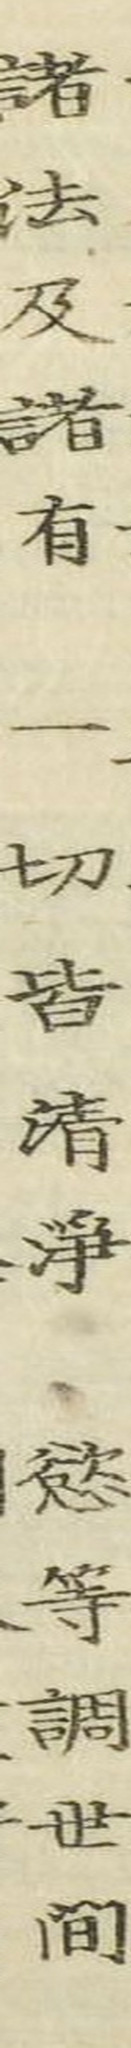諸法及諸有一切皆清淨慾等調世間
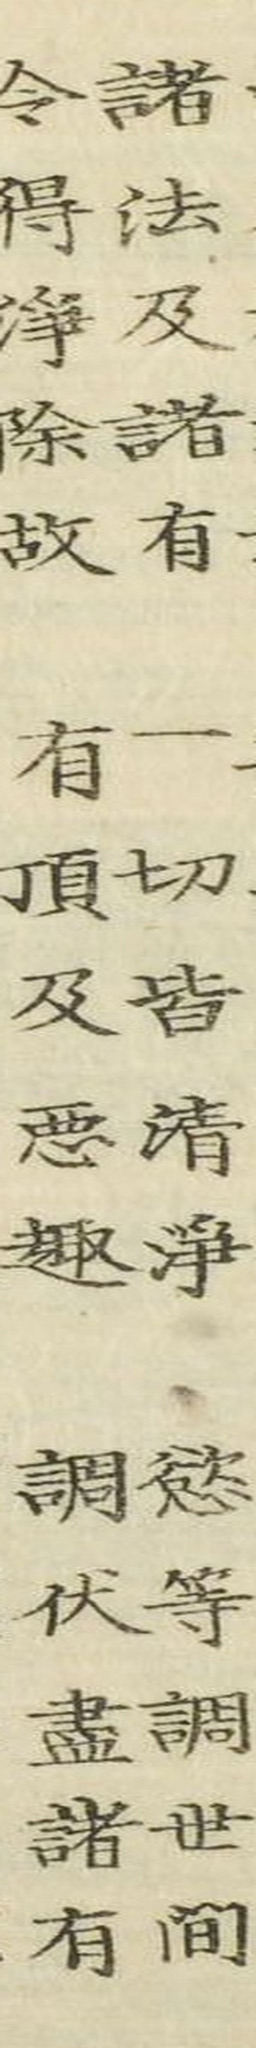令得淨除故有頂及𢙣趣調伏盡諸有
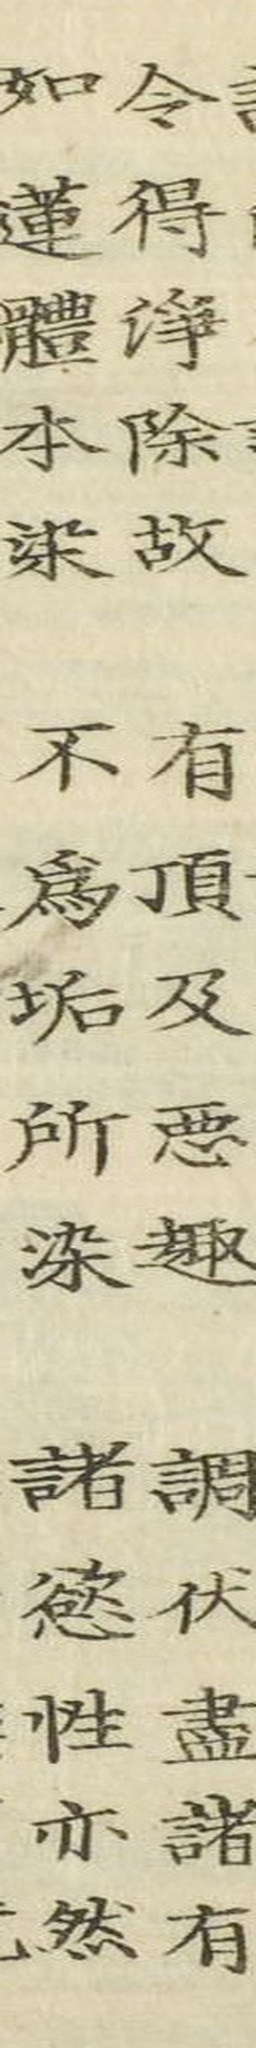如蓮體本染不爲垢所染諸慾性亦然
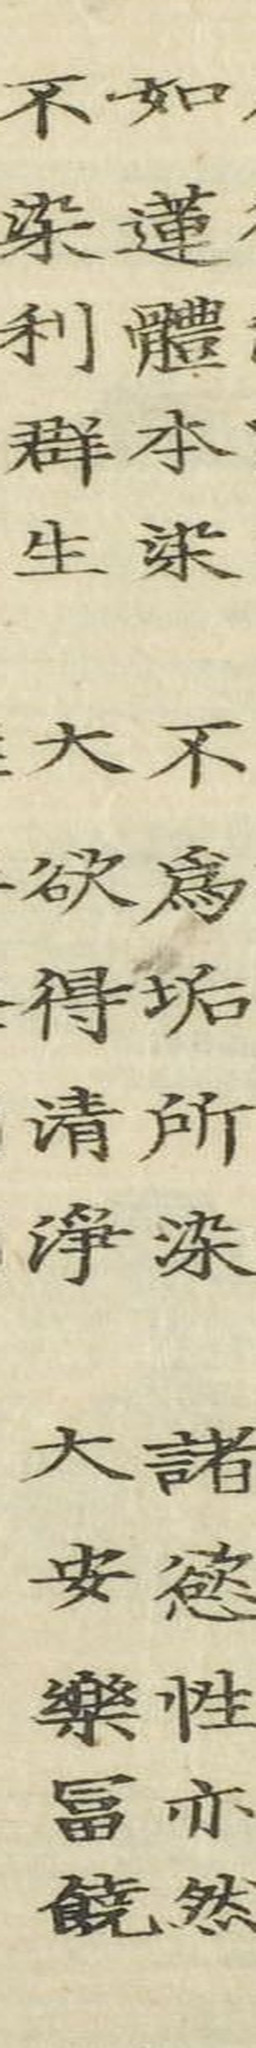不染利群生大欲得清淨大安樂冨饒
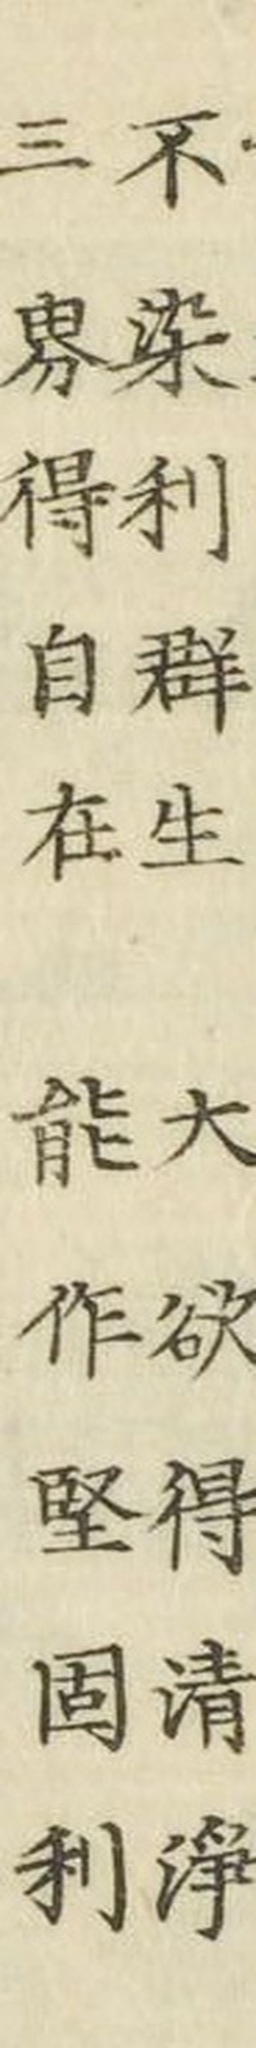三界得自在能作堅固利
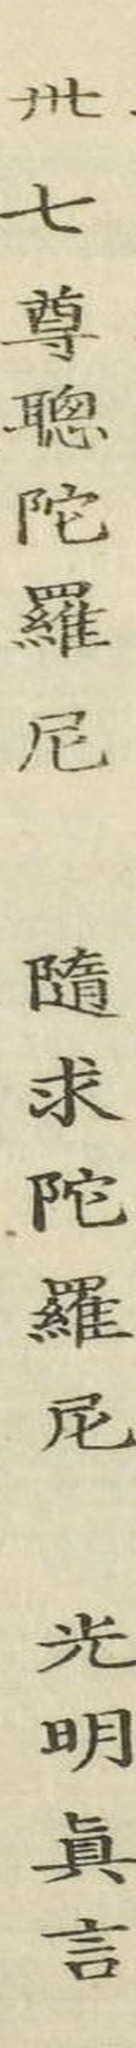卅七尊聰陀羅尼隨求陀羅尼光明眞言
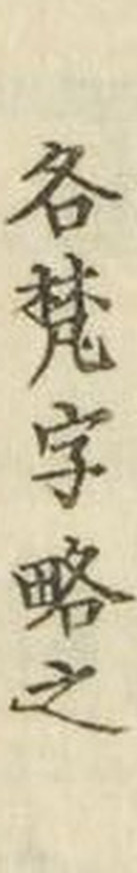各梵字略之
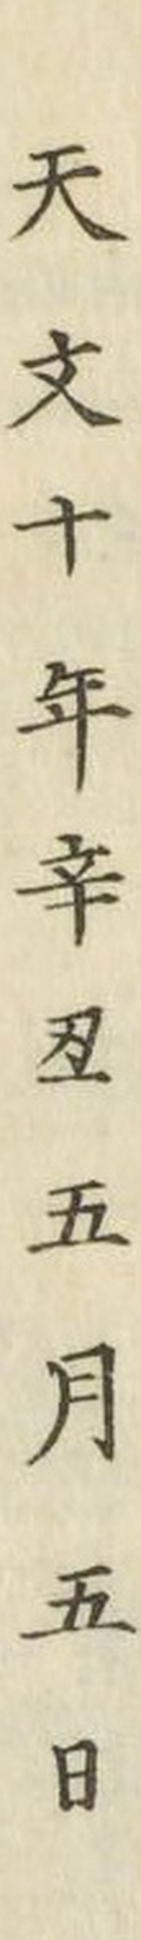天文十年辛丑五月五日
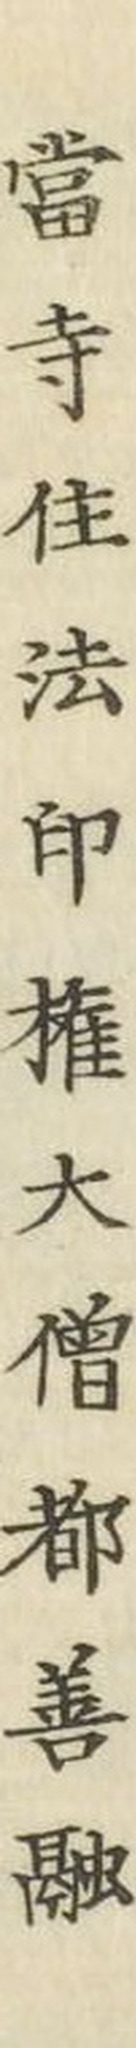當寺住法印権大僧都善融
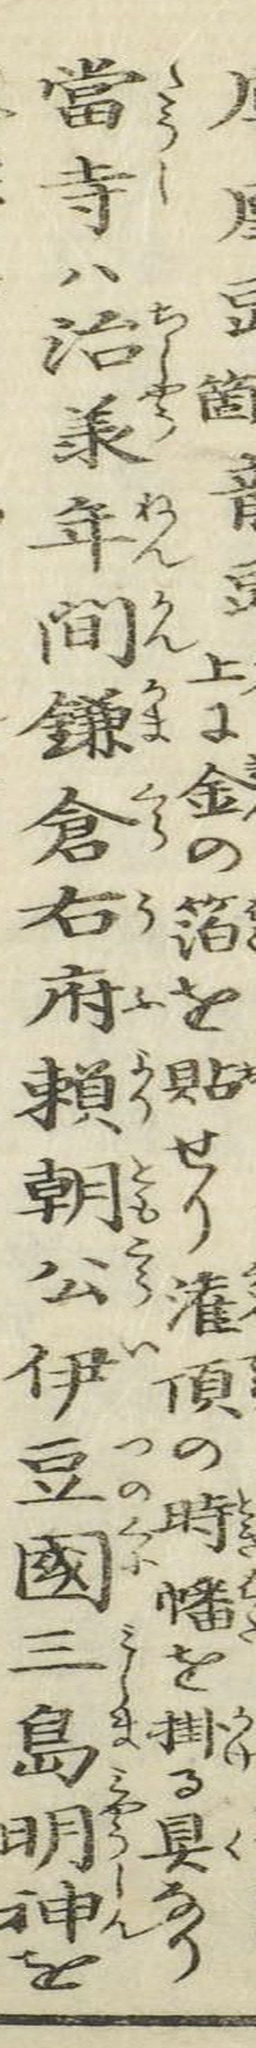當寺は治承年間鎌倉右府頼朝公伊豆國三島明神を
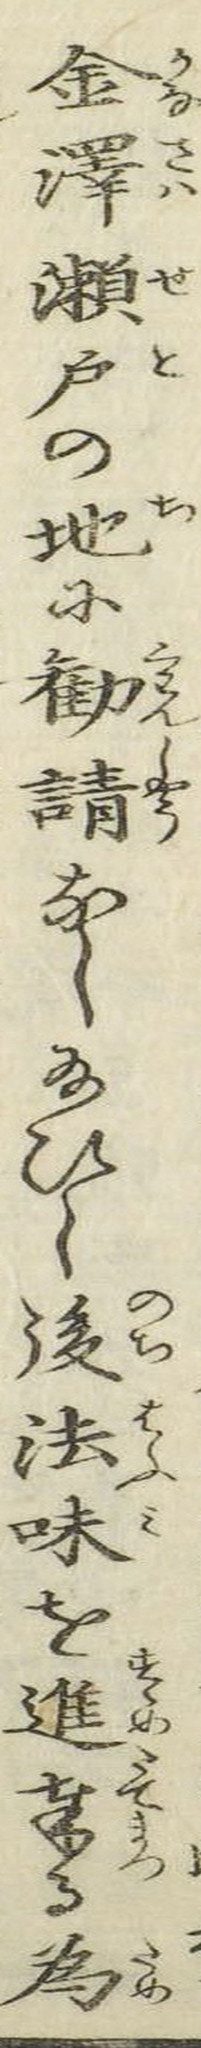金澤瀬戸の地に勧請なし給ひし後法味を進奉る為
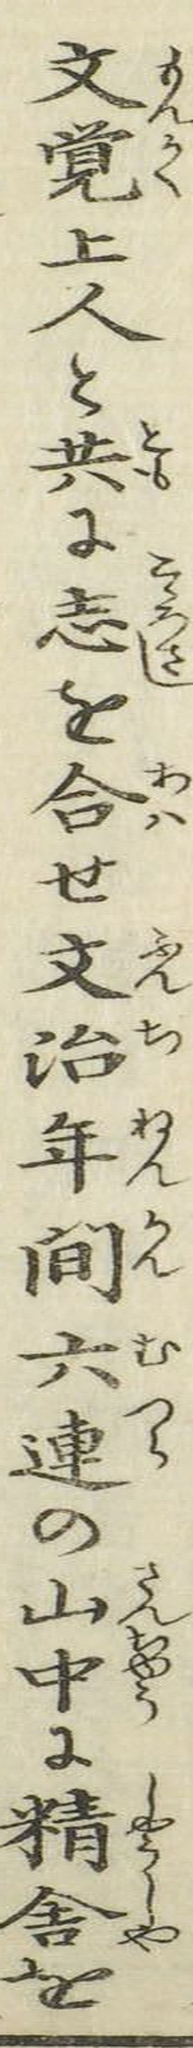文覚上人と共に志を合せ文治年間六連の山中に精舎を
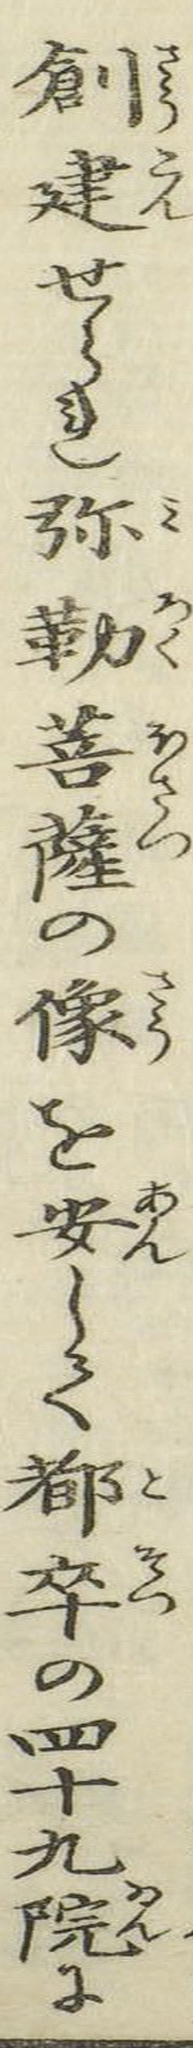創建せられ弥勒菩薩の像を安して都卒の四十九院に
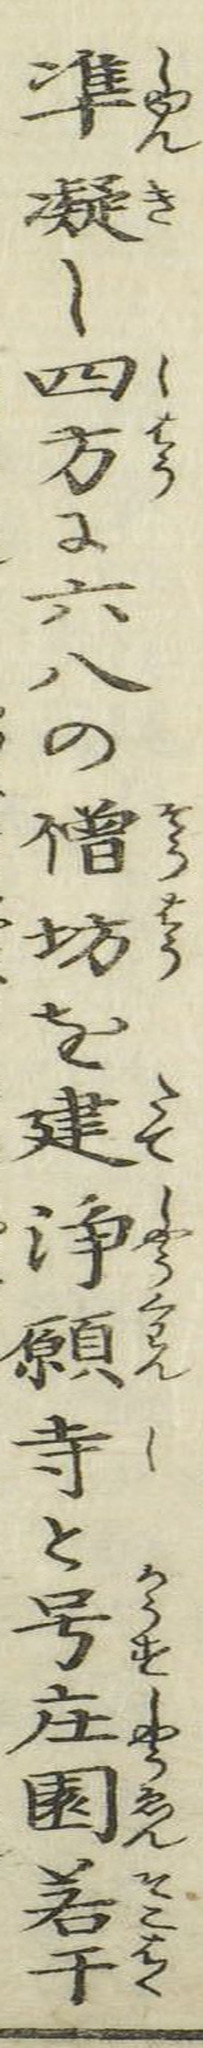準凝し四方に六八の僧坊を建浄願寺と号庄園若干
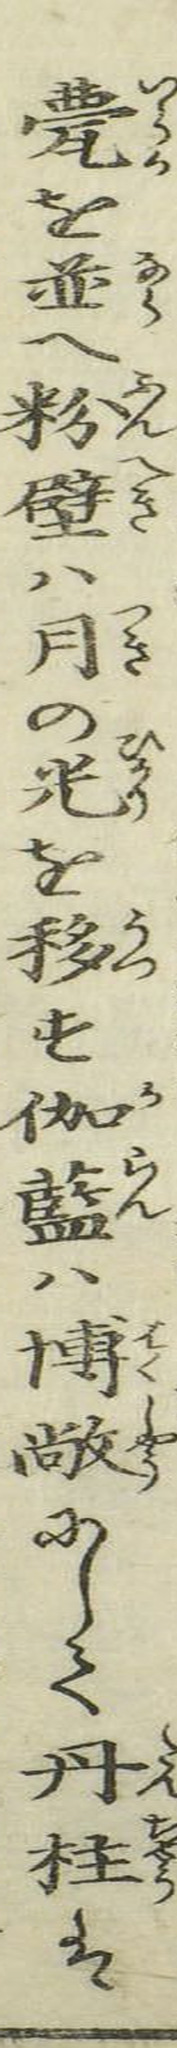甍を並へ粉壁は月の光を移す伽藍は博敞にして丹柱は
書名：江戸名所図会 20巻 巻之6
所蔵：東京学芸大学教育コンテンツアーカイブ
